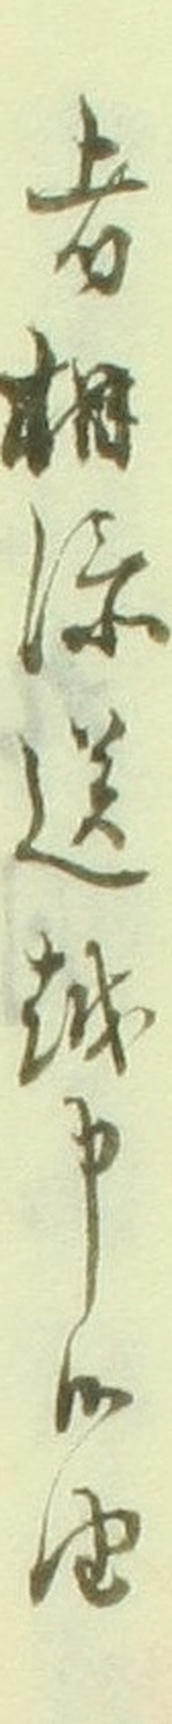者相添送越申候由
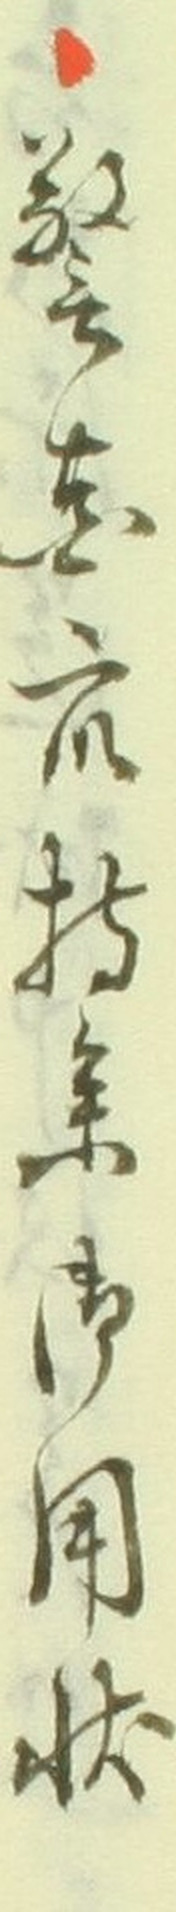警固衆持参御用状
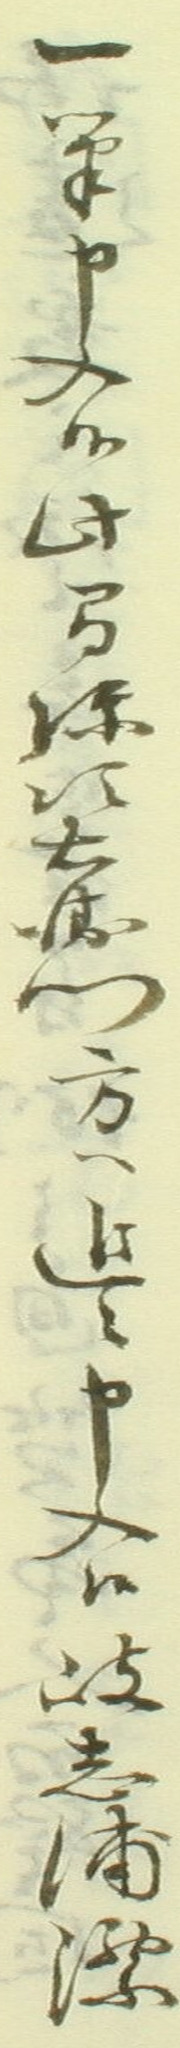一筆申入候此間弥次右衛門方へ追々申入候岐志浦漂
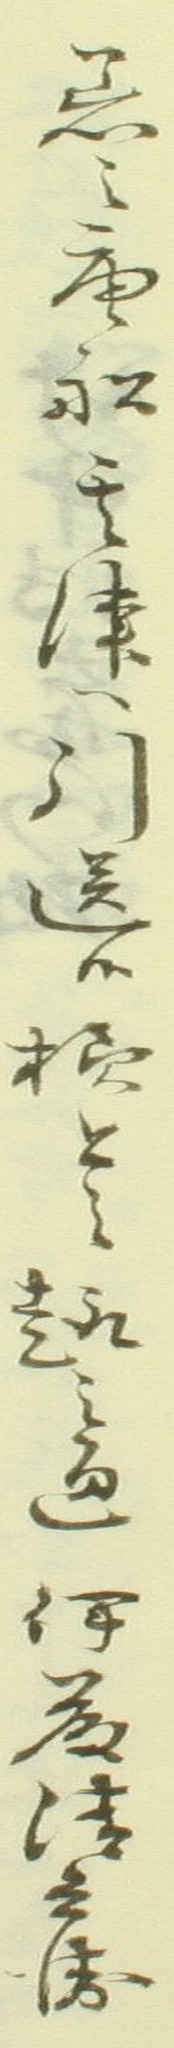着之唐船其津へ引送候様之趣之通伊藤清兵衛
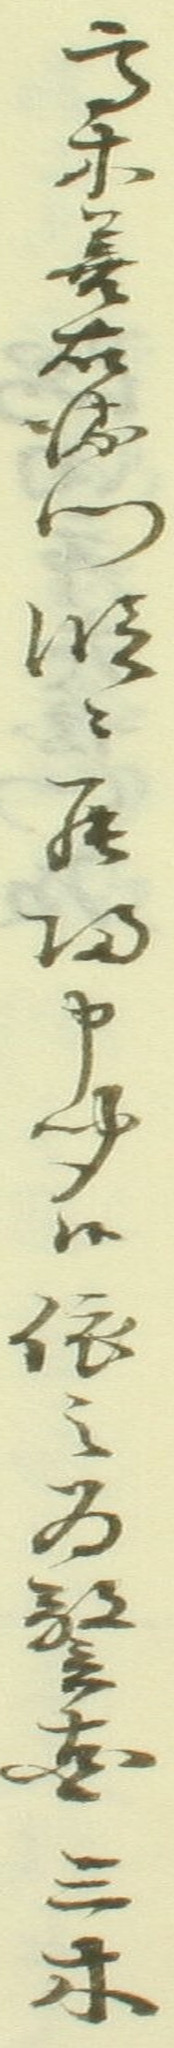高木善右衛門段々罷帰申聞候依之為警固三木
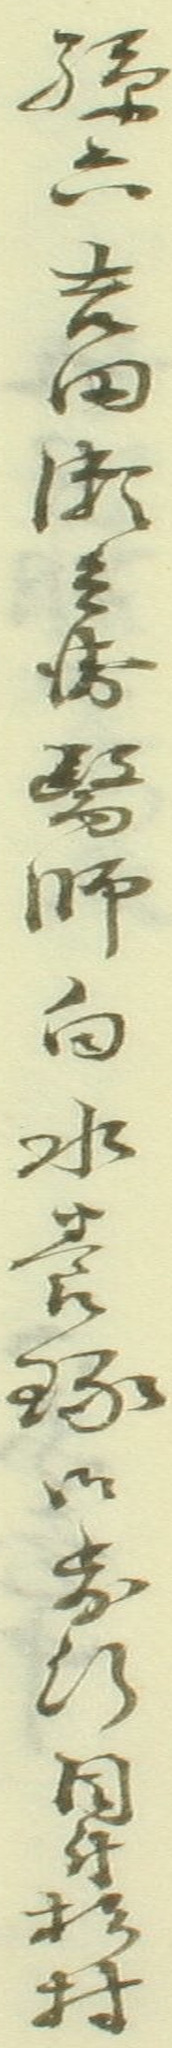孫六吉田瀬兵衛医師白水養琢御歩行目付杉村
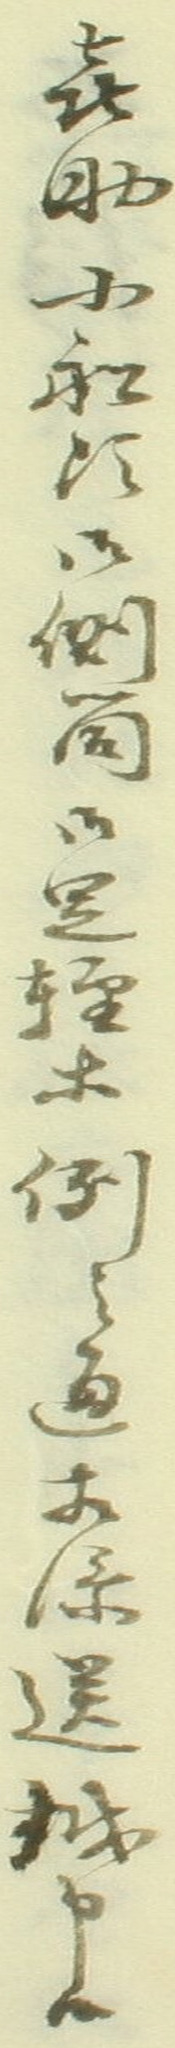喜助小船頭御側筒御足軽等例之通相添送越申候
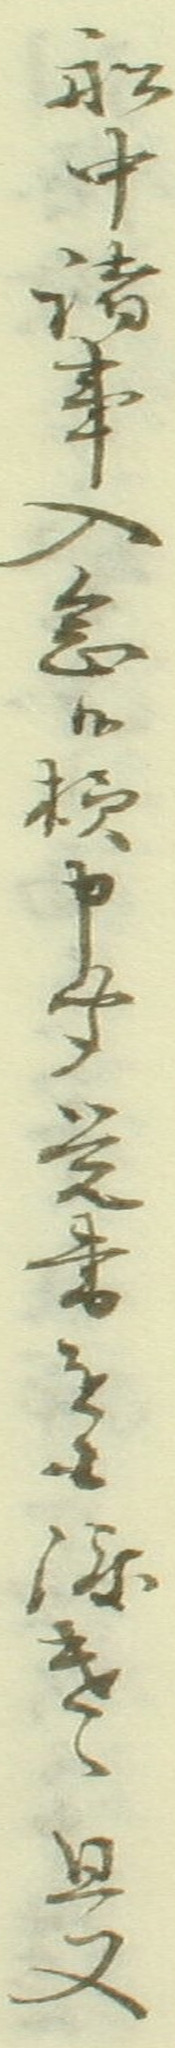船中諸事入念候様申聞覚書をも渡遣候且又
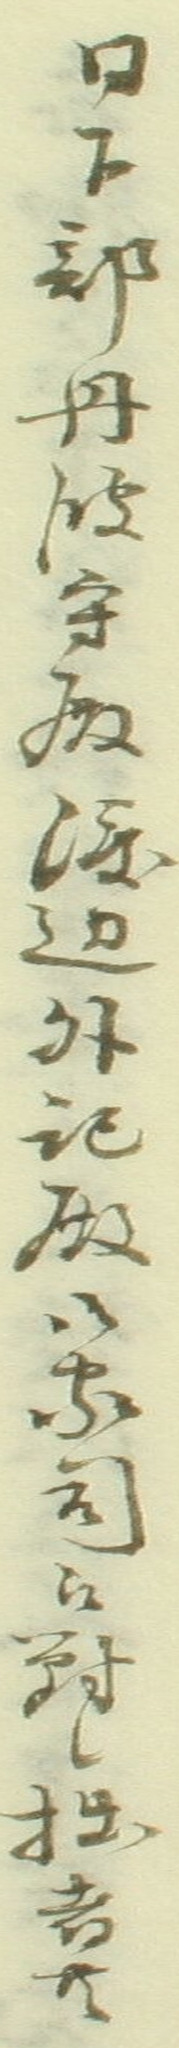日下部丹波守殿渡辺外記殿御家司え対し拙者共
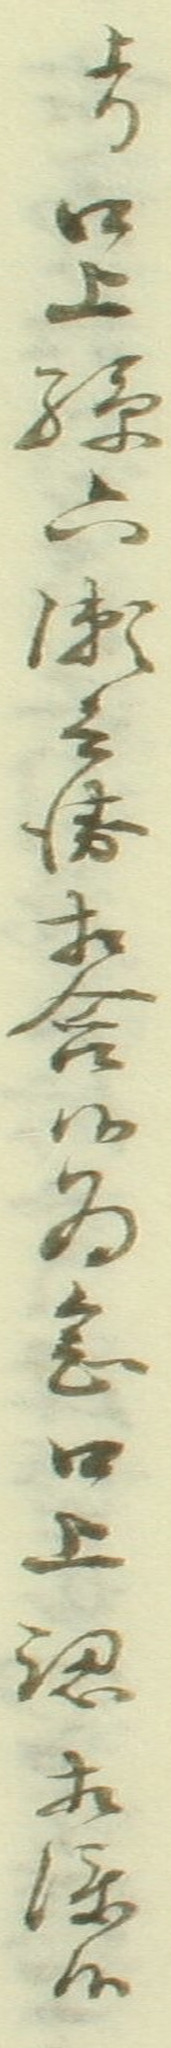より口上孫六瀬兵衛相含候為念口上認相渡候
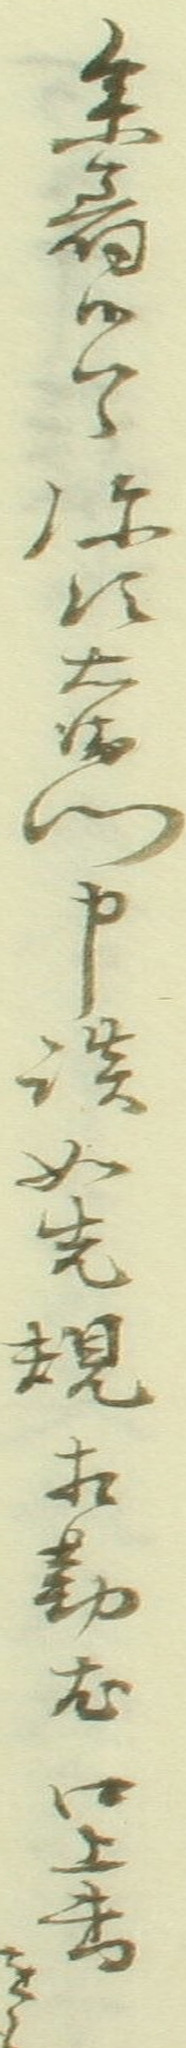参着候はゝ弥次右衛門申談如先規相勤尤口上書をも
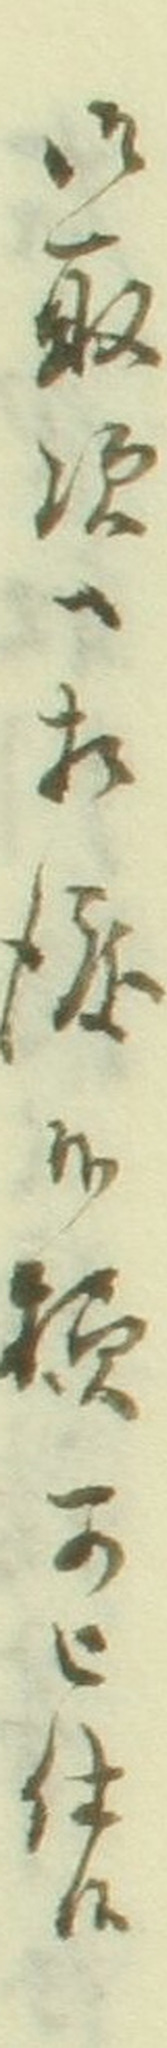御取次へ相渡候様可被仕候
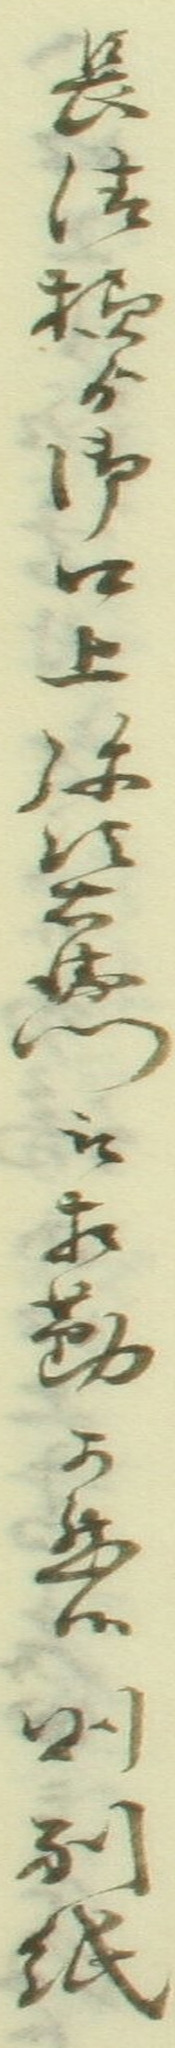長清様ゟ御口上弥次右衛門被相勤可然候則別紙

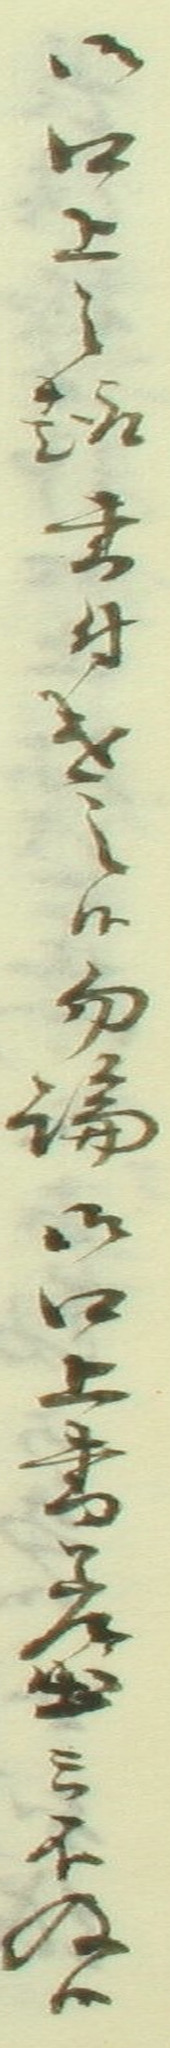御口上之趣書付遣之候勿論御口上書差出には不及候
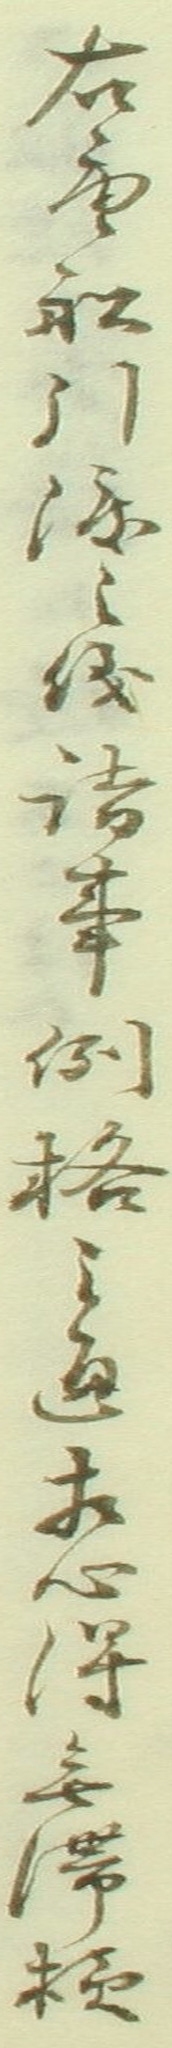右唐船引渡之儀諸事例格之通相心得無滞様
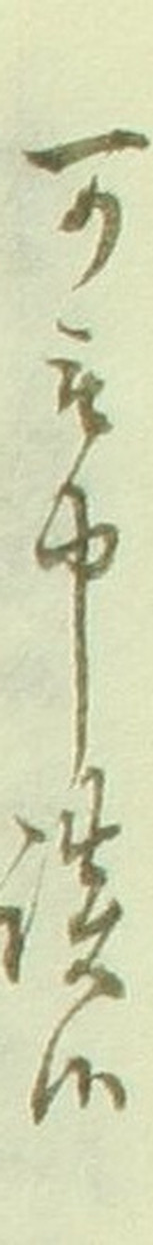可被申談候
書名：異国船漂着記
